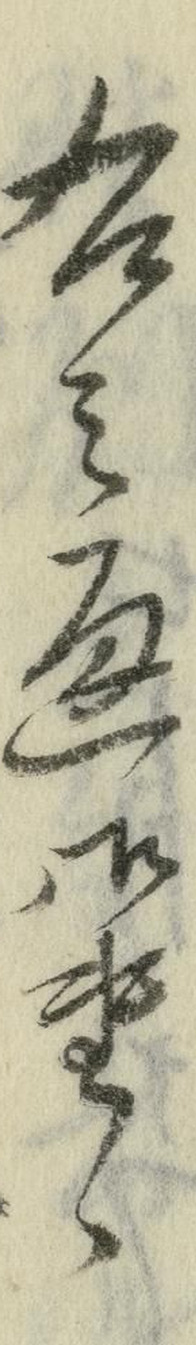右之通御座候
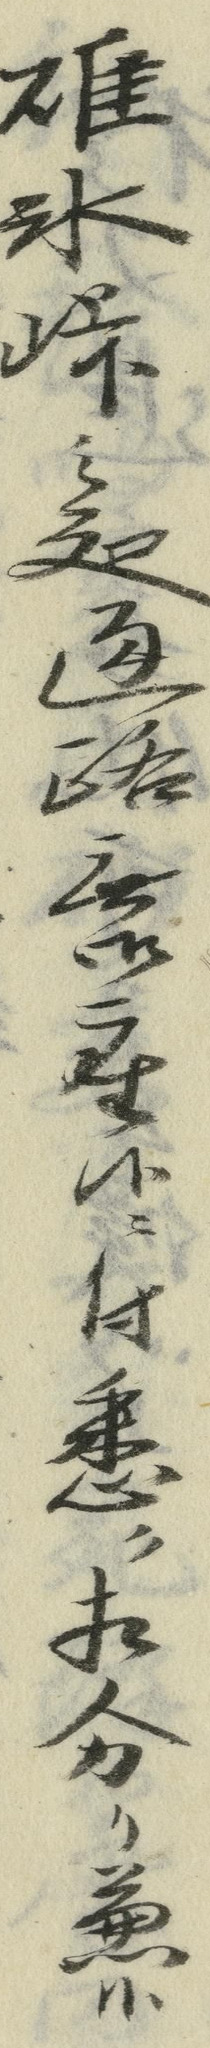碓氷峠之処通路無御座候ニ付悉ク相分リ兼候
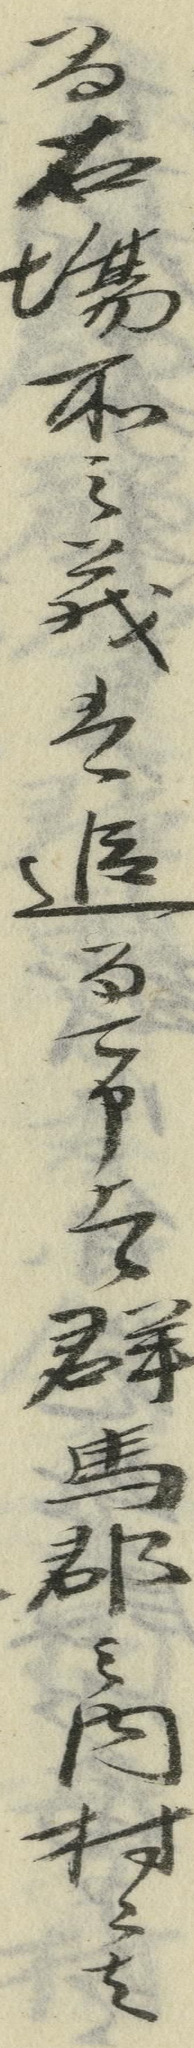間右場所之義は追而可申上候群馬郡之内村々は
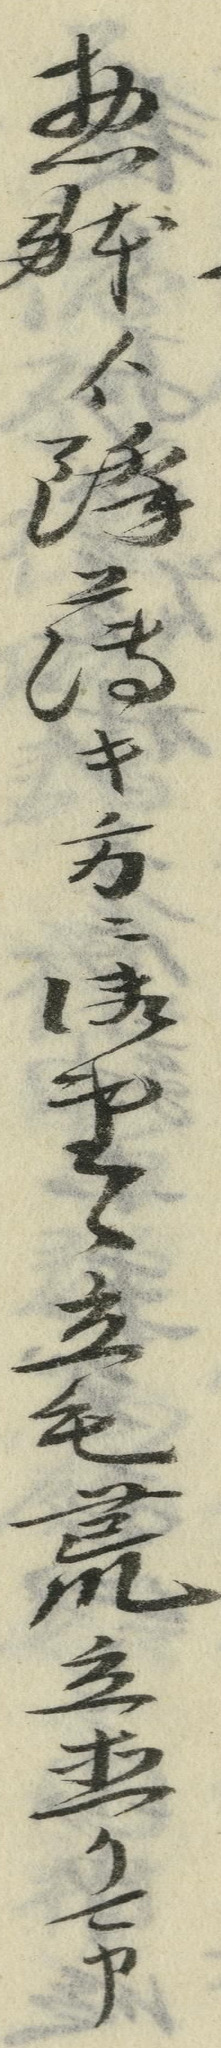惣体ゟ降薄キ方ニ御座候立毛荒立直り可申
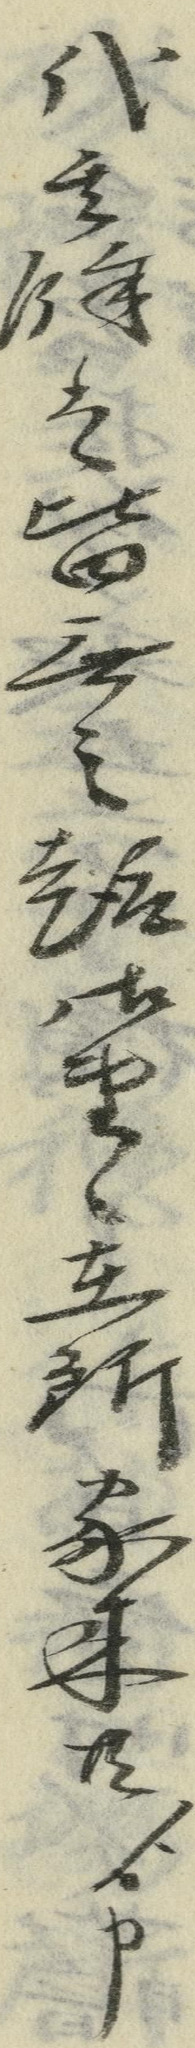哉其余は皆無之趣御座候在所家来共ゟ申
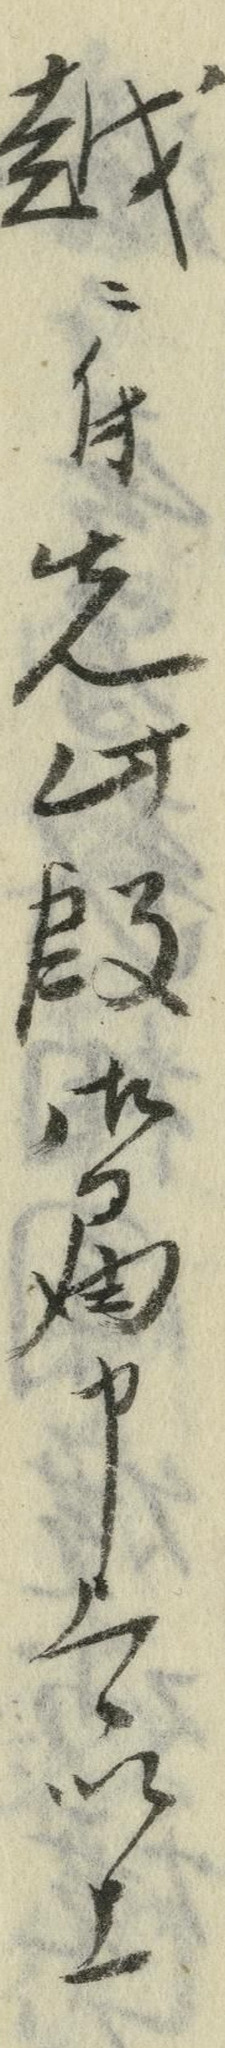越ニ付先此段御届申上候以上
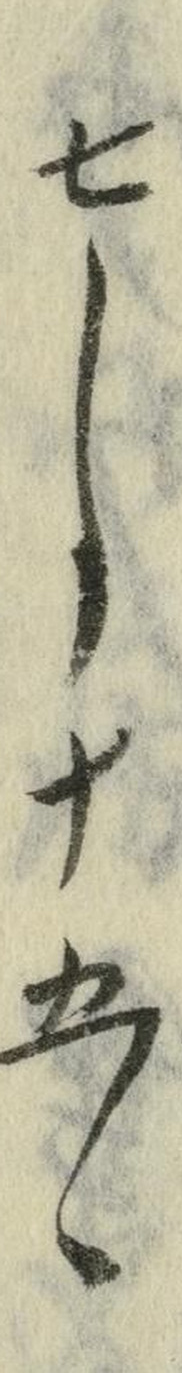七月十五日
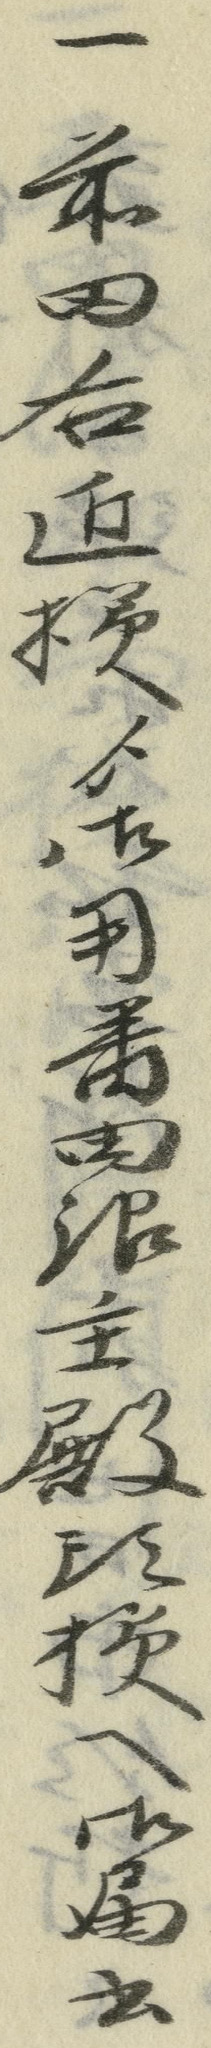一前田右近様ゟ御用番田沼主殿頭様ヘ御届書
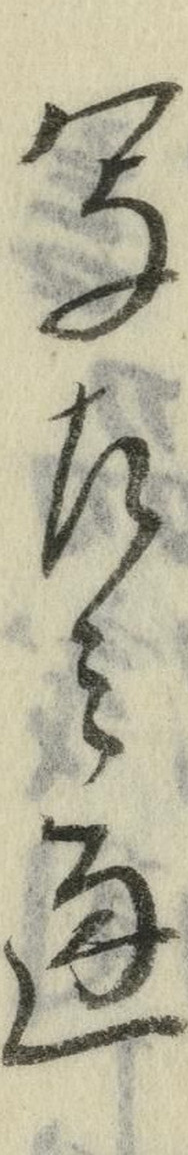写左之通

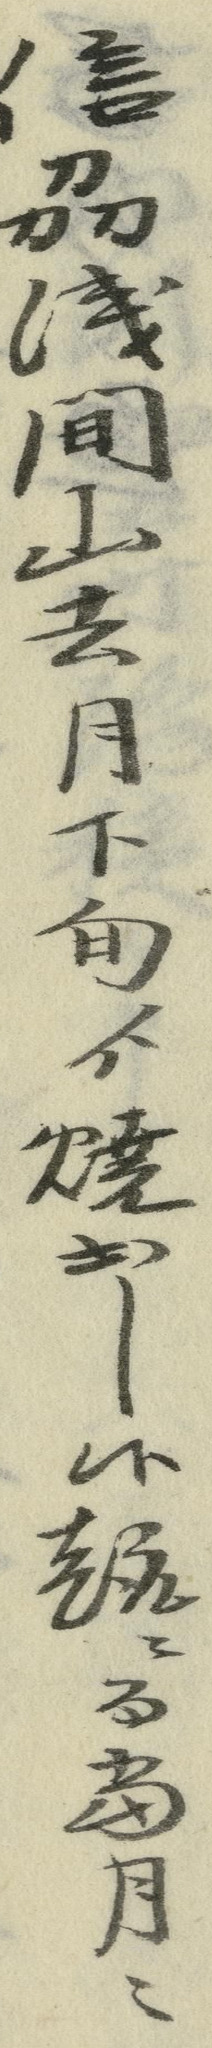信州浅間山去月下旬ゟ焼出し候趣ニ而当月ニ
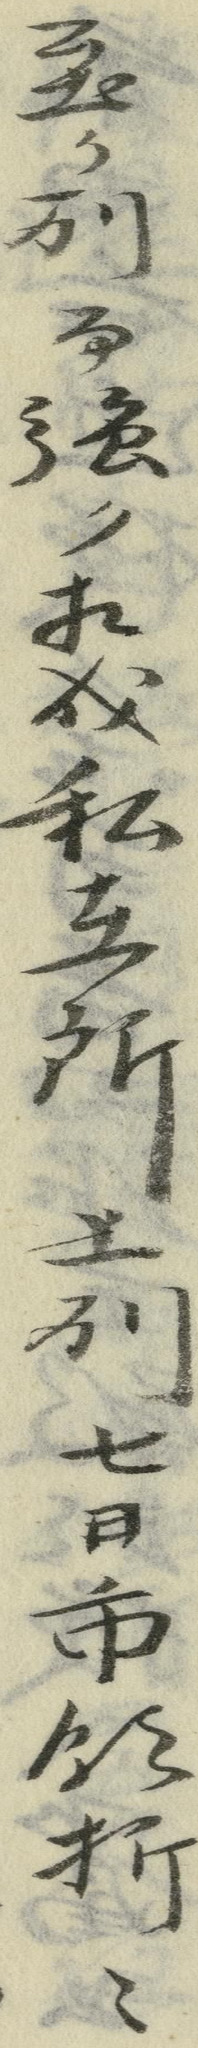至リ別而強ク相成私在所上州七日市領折々
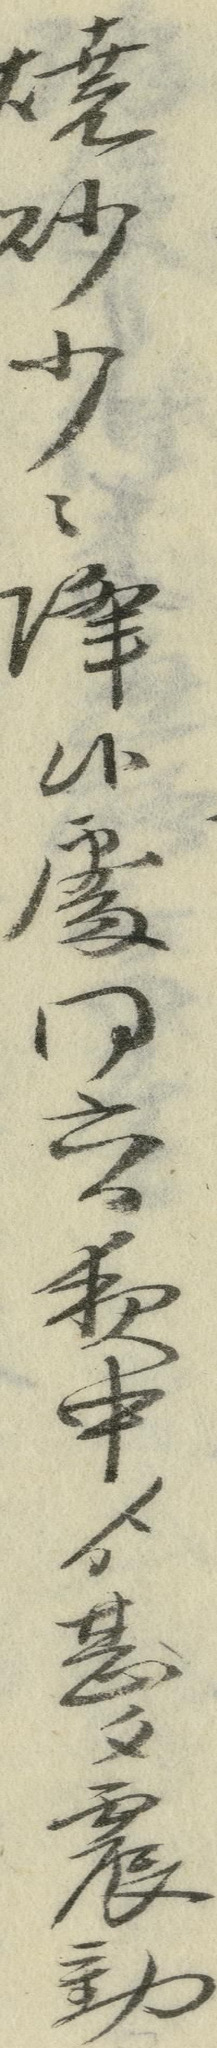焼砂少々降候処同六日夜中ゟ甚タ震動
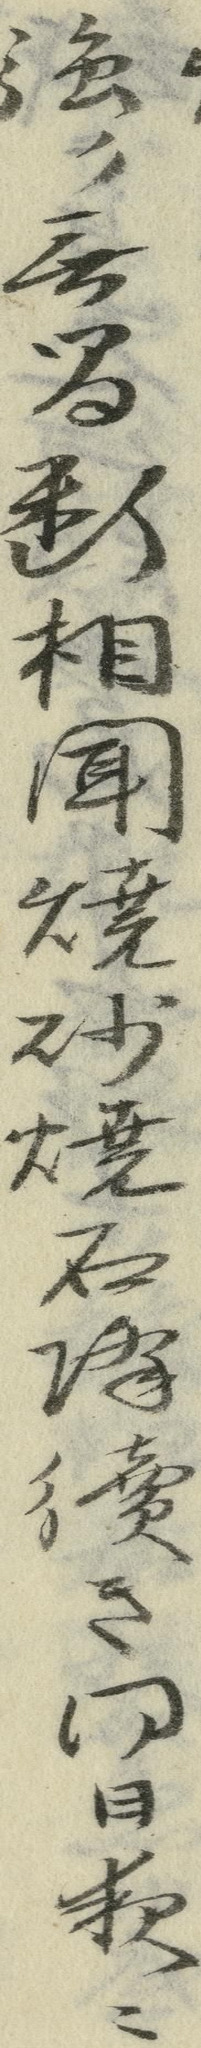強ク無間断相聞焼砂焼石降続き同日夜ニ
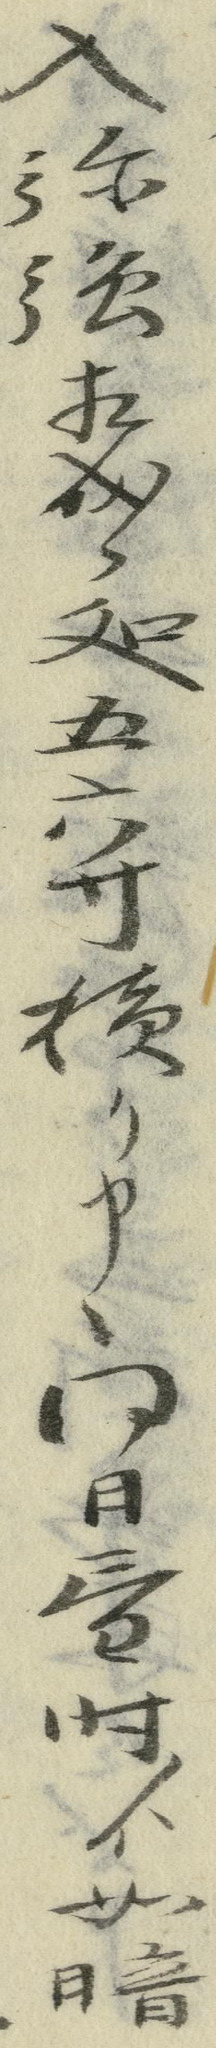入弥強相成候処五六寸積り申候同日昼時ゟ如暗
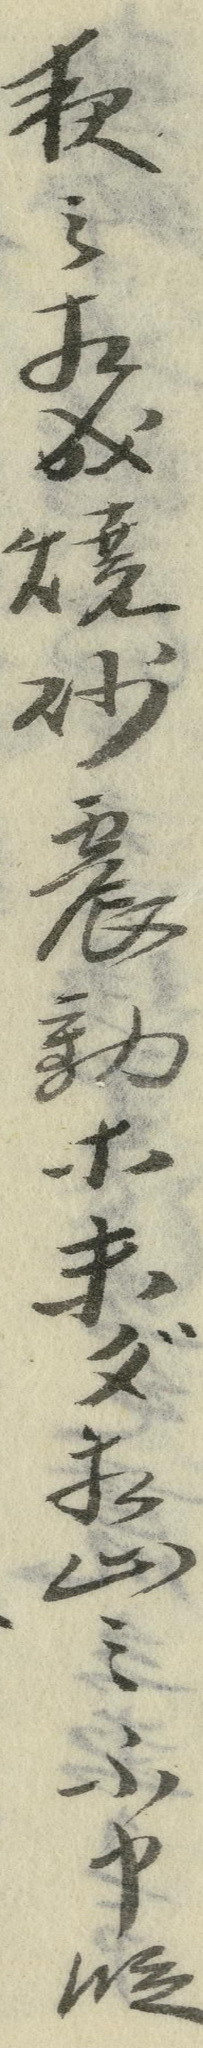夜之相成焼砂震動等未ダ相止み不申段
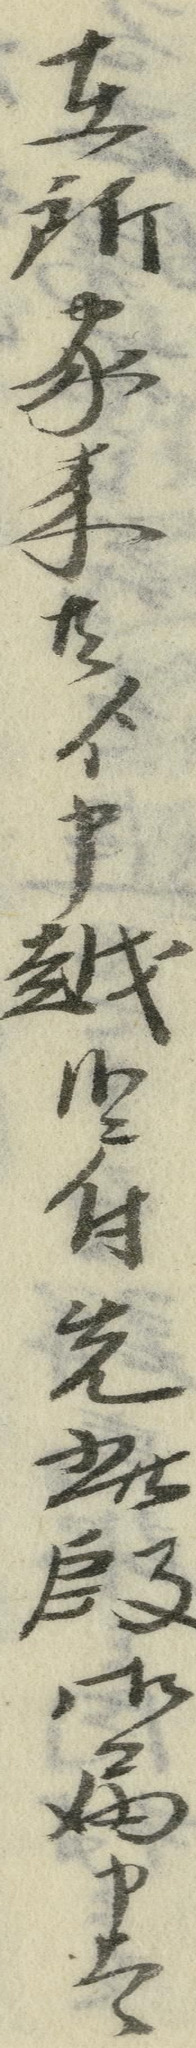在所家来共ゟ申越候ニ付先此段御届申上候
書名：天明三癸卯七月信州浅間山焼出シ上州山津浪ニ付近國ヨリ御届書并訴書写
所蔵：東京大学地震研究所図書室 Earthquake Research Institute Library, The University of Tokyo, JAPAN
